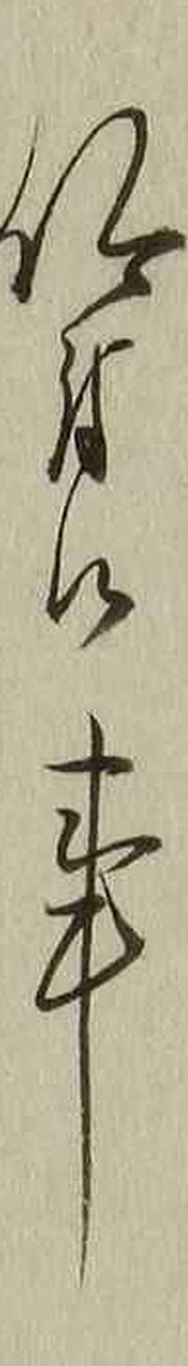仰付候事
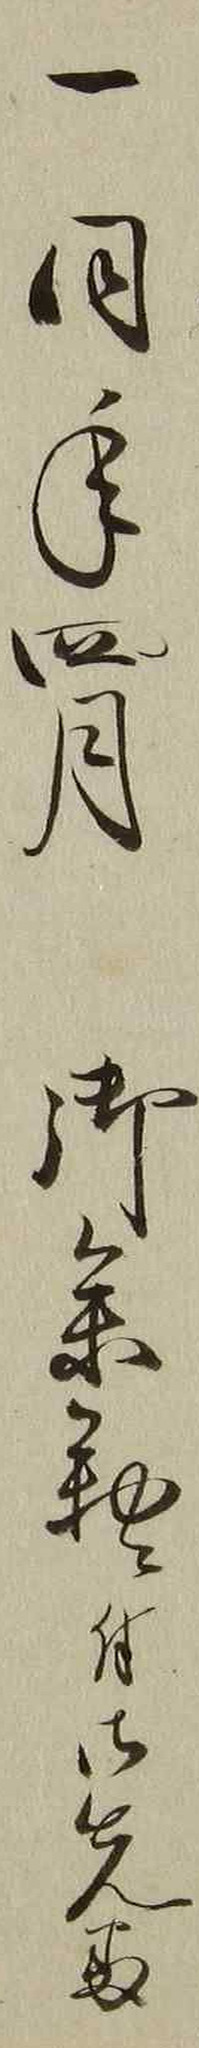一同年四月御参勤に付御先番
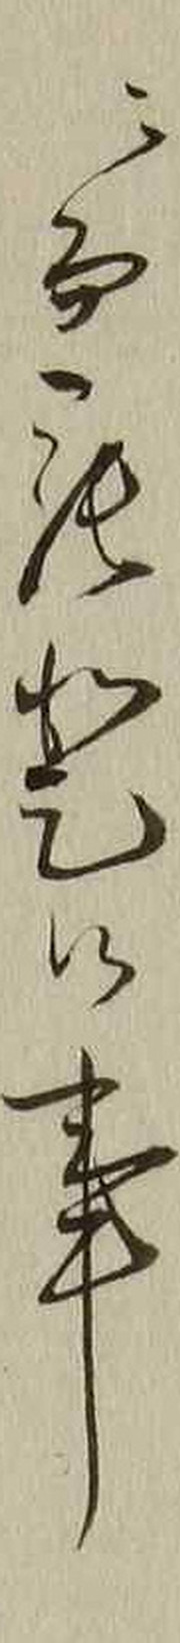に而罷登候事
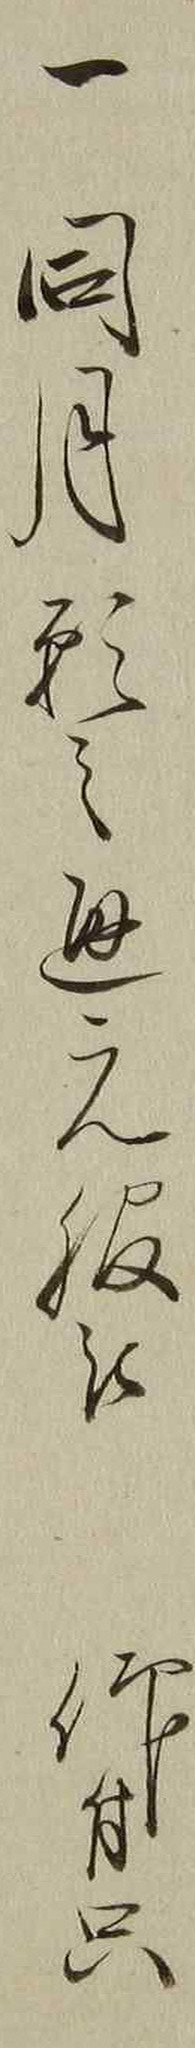一同月願之通元服被仰付只
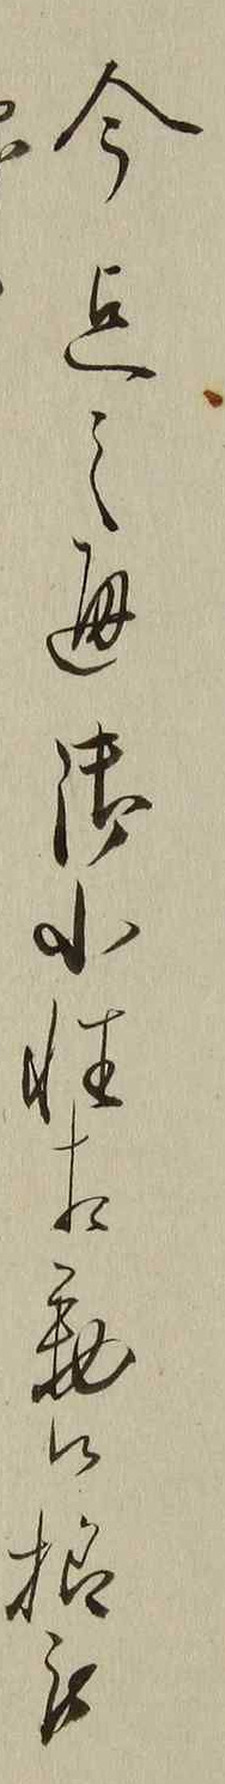今迄之通御小性相勤候様被
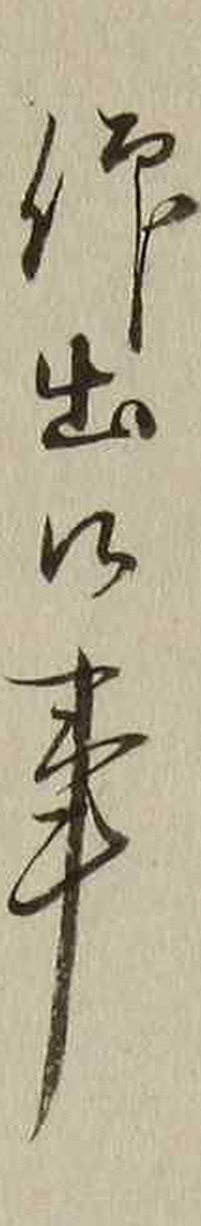仰出候事
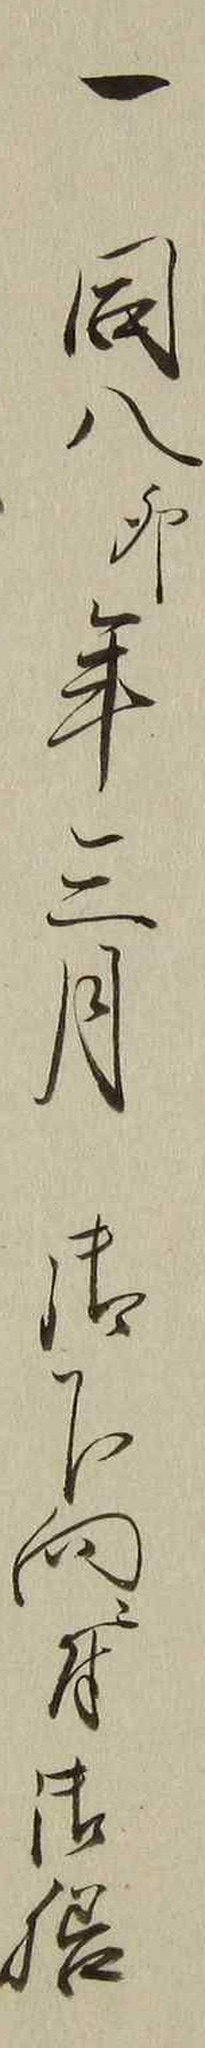一同八卯年三月御下向に付御膳
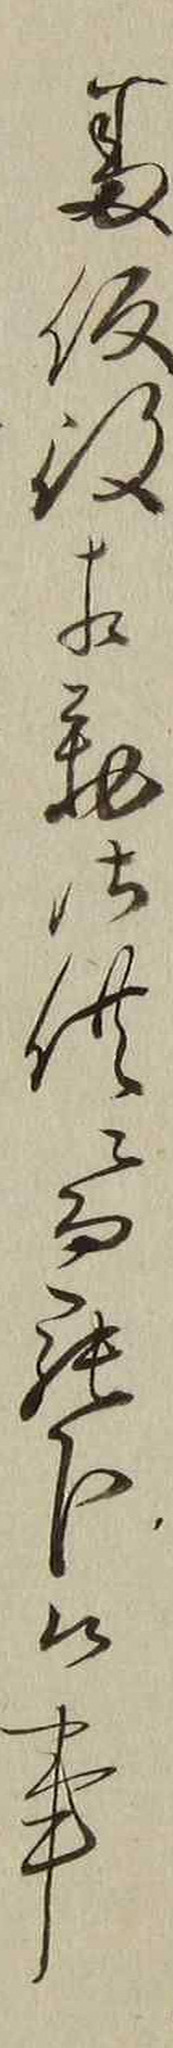番仮役相勤御供に而罷下候事
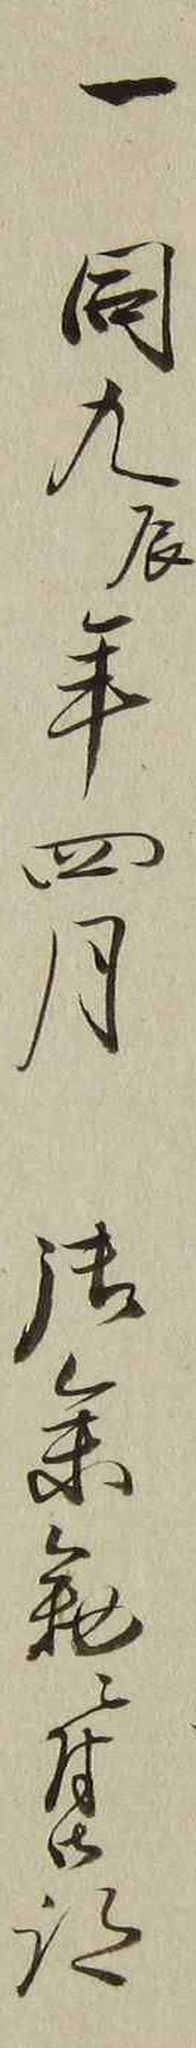一同九辰年四月御参勤に付御後
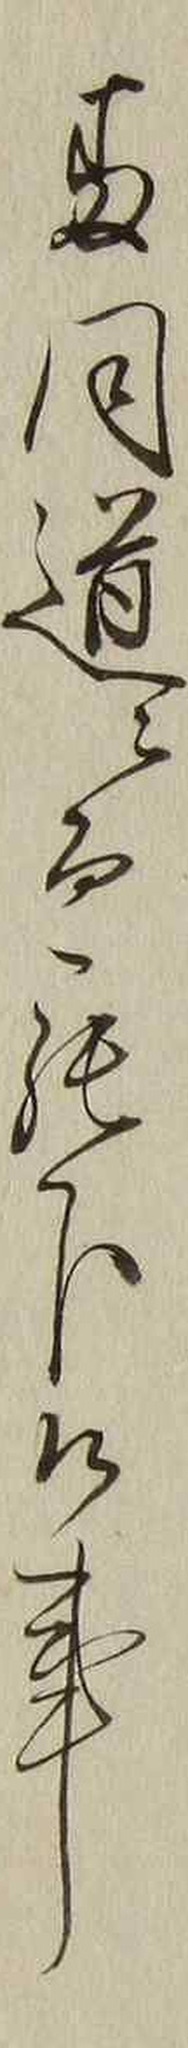番同道に而罷下候事
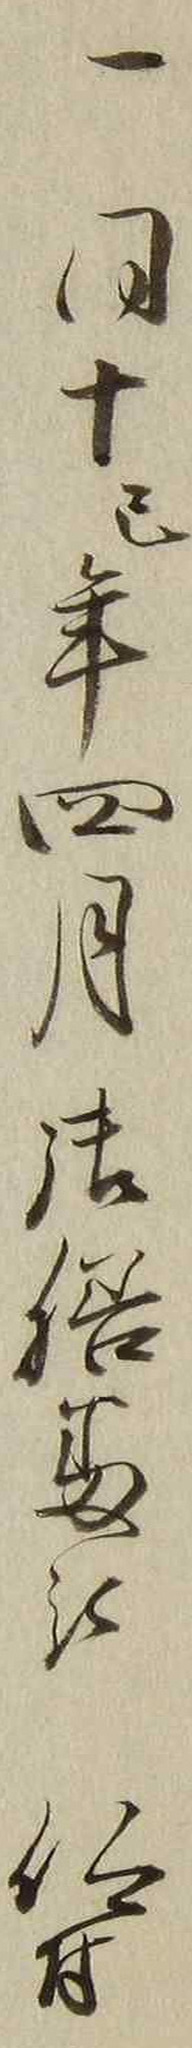一同十巳年四月御膳番被仰付
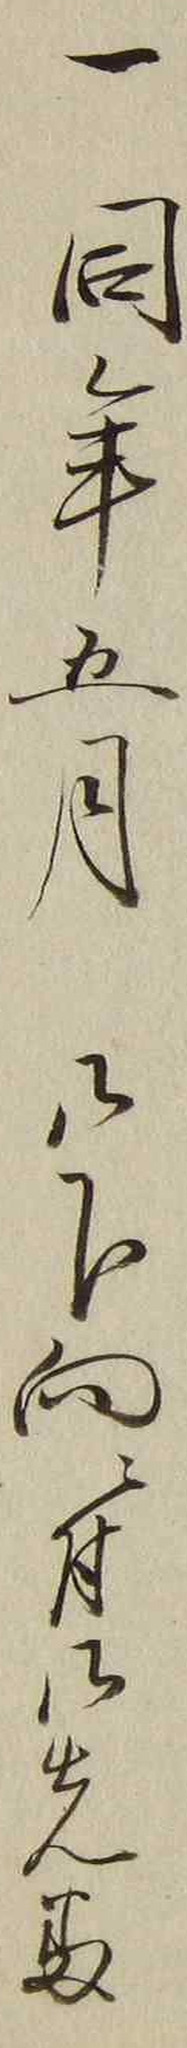一同年五月御下向に付御先番
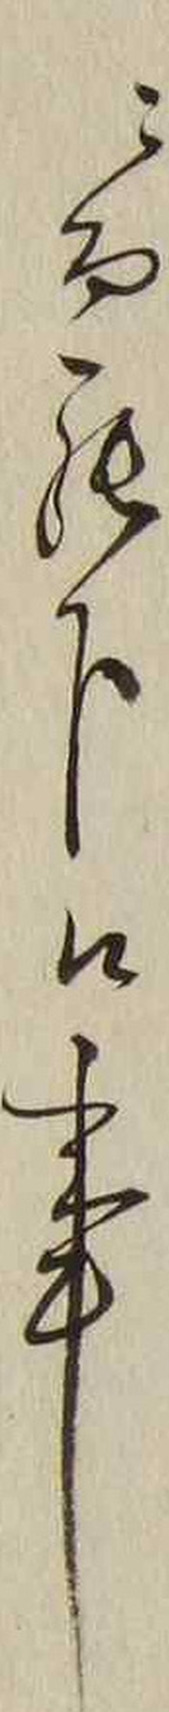に而罷下候事

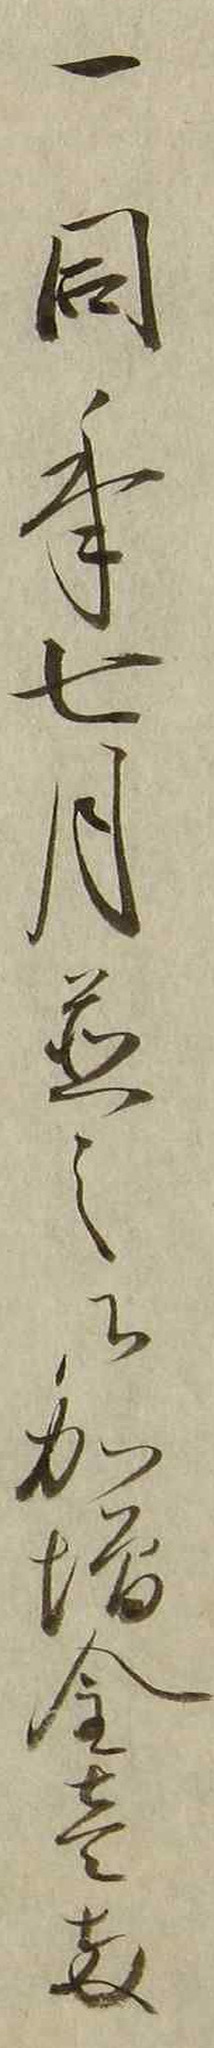一同年七月並之御加増金壱両
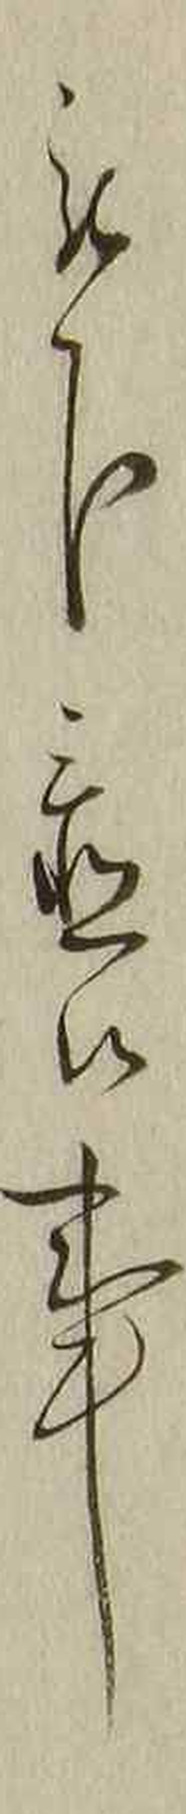被下置候事
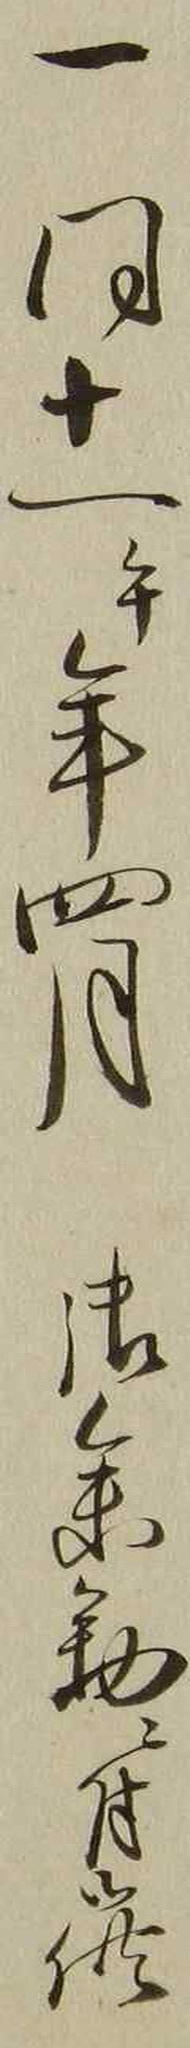一同十一午年四月御参勤に付御供
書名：諸士系譜　巻之103　か之部11
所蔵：会津若松市立会津図書館
